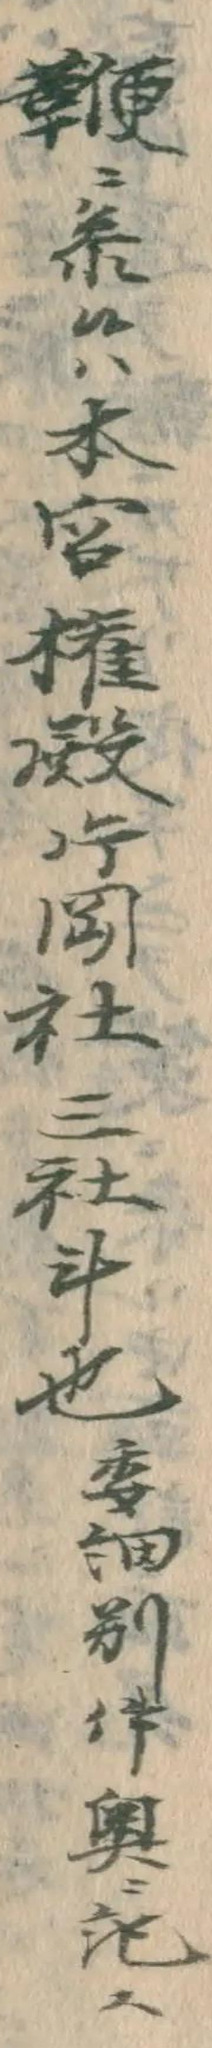鞭ニ参候ハ本宮権殿片岡社三社計也委細別件奥ニ記ス

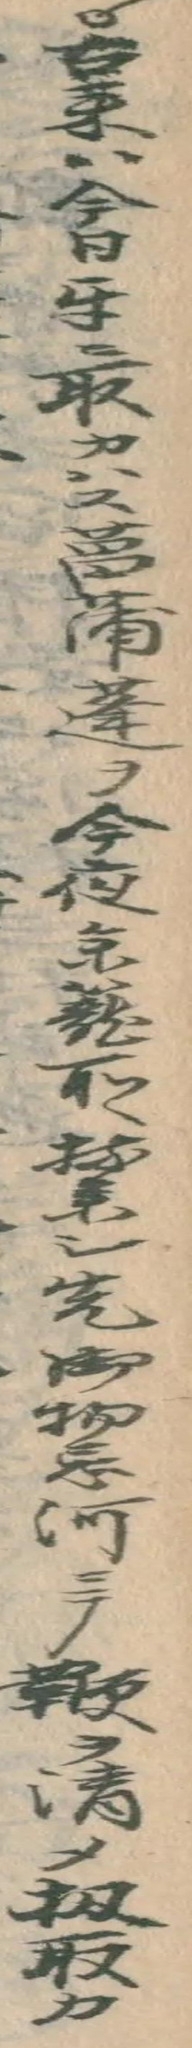\○古来ハ今日互ニ取カハス菖蒲蓬ヲ今夜参籠所へ持参シ先御物忌河ニテ鞭ヲ清メ扨取カ
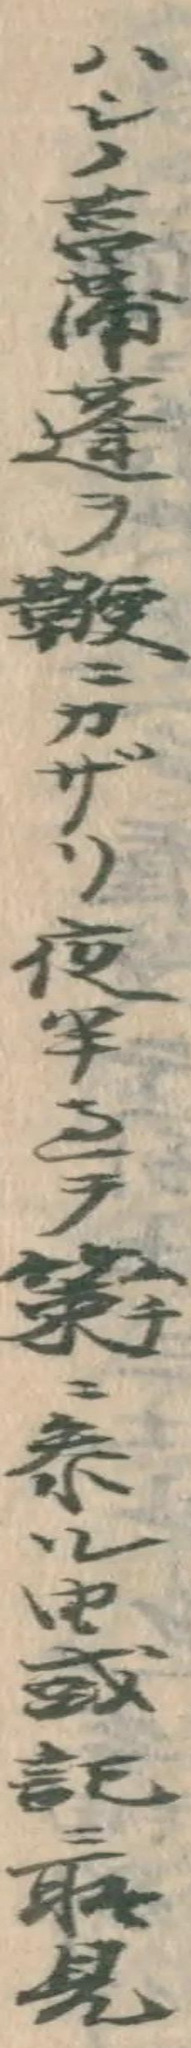ハシノ菖蒲蓬ヲ鞭ニカザリ夜半過テ䇿ニ参ル由或記ニ所見
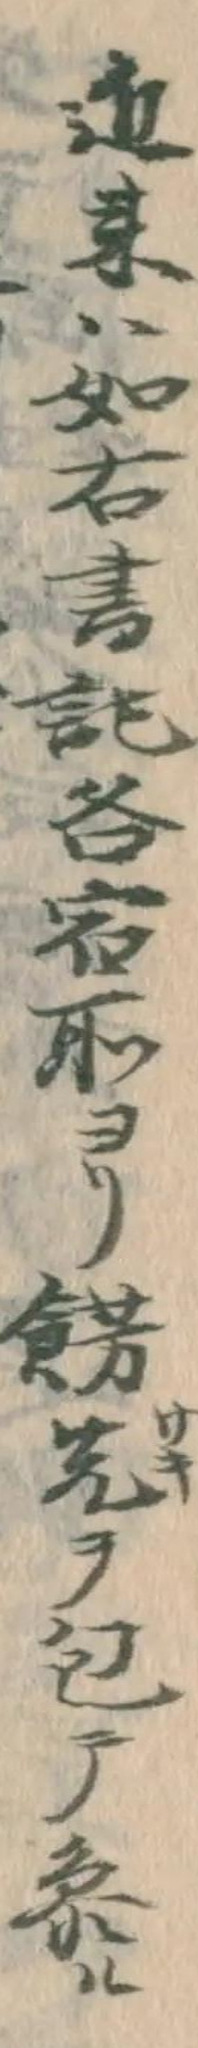近来ハ如右書記各宿所ヨリ餝先ヲ包テ参ル
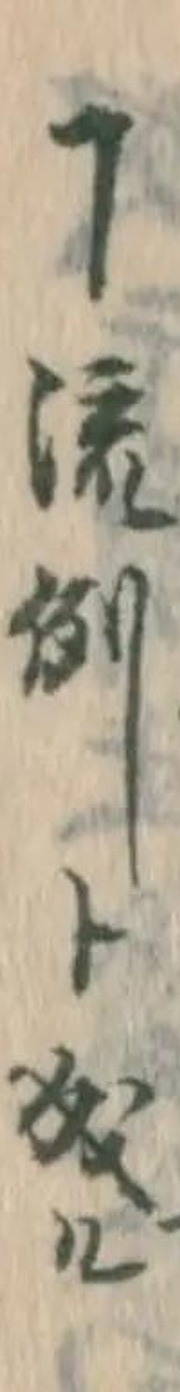コト流例ト成ル
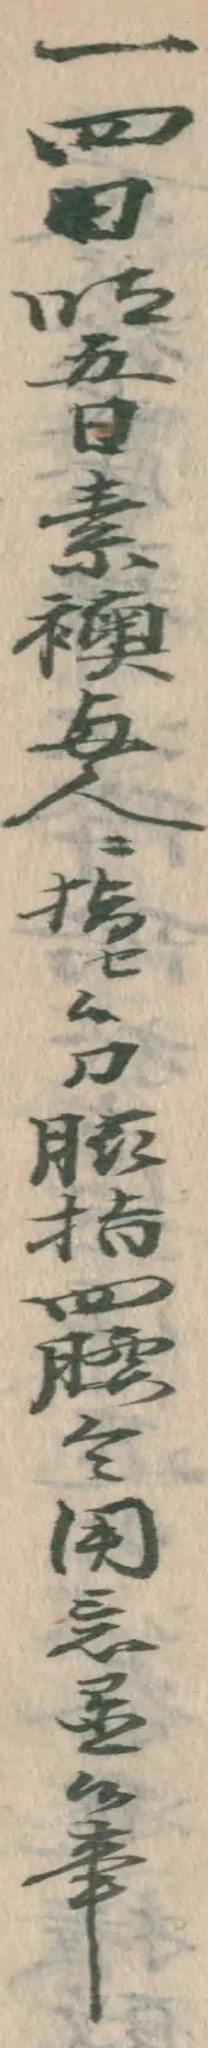一四日明五日素襖両人二指セ候刀脇指四腰令用意置候事
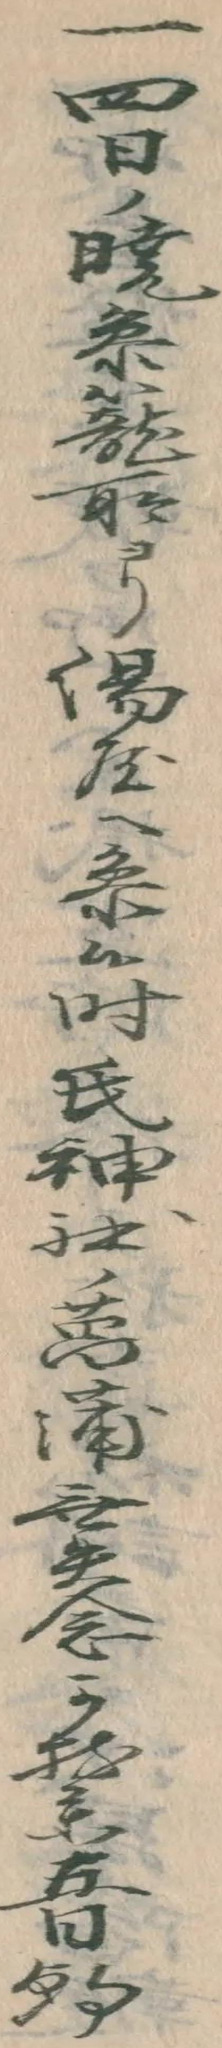一四日ノ暁参籠所ヨリ湯屋へ参候時氏神社ノ菖蒲無失念可持参五日朝
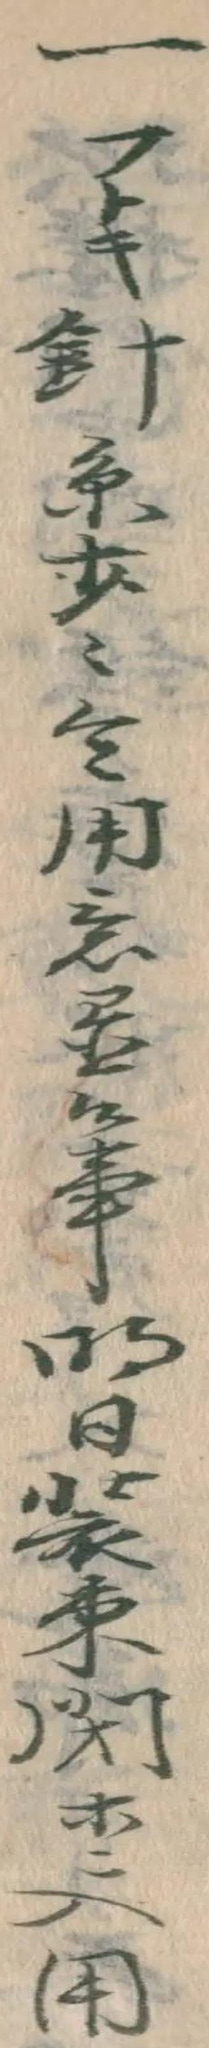一フトキ針糸少々令用意置候事明日装束閉等ニ入用
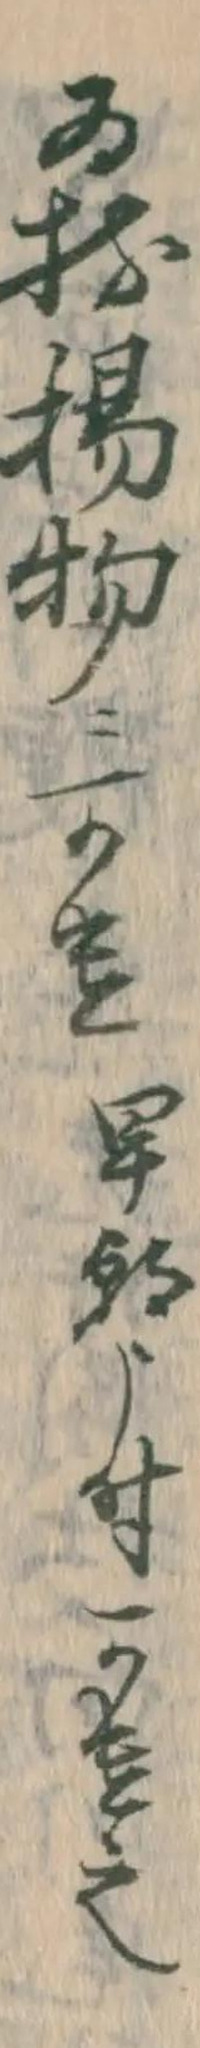為持揚物ニ可遣早朝申付可遣之
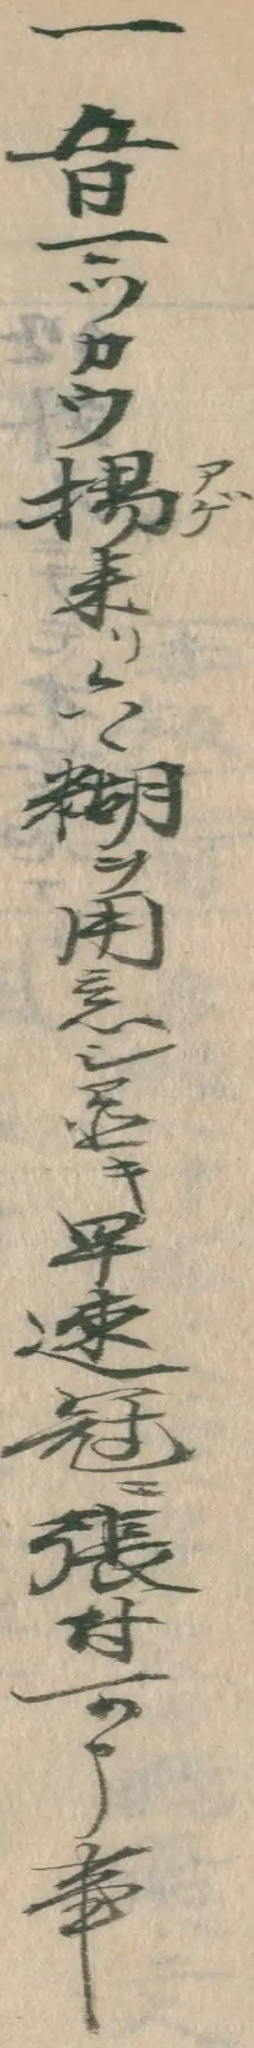一五日マツカウ揚来リ候ハヽ糊ヲ用意シ置キ早速冠ニ張付可申事
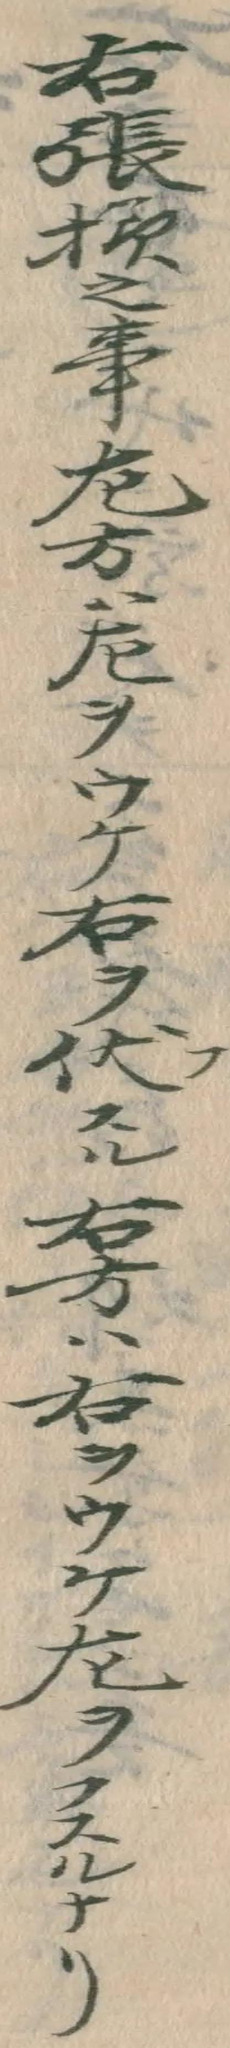右張様之事左方ハ左ヲウケ右ヲ伏スル右方ハ右ヲウケ左ヲフスルナリ
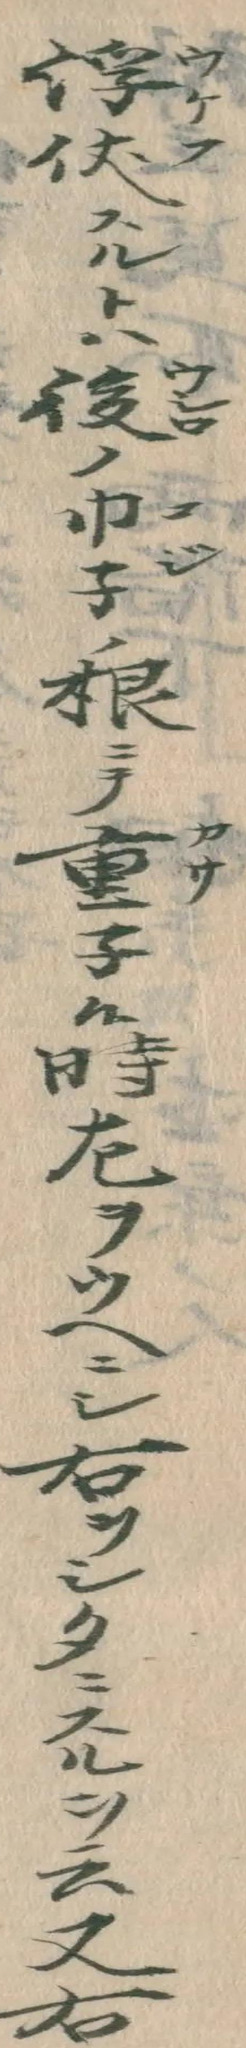浮伏スルトハ後ノ巾子ノ根ニテ重ネ候時左ヲウヘニシ右ヲシタニスルヲ云又右
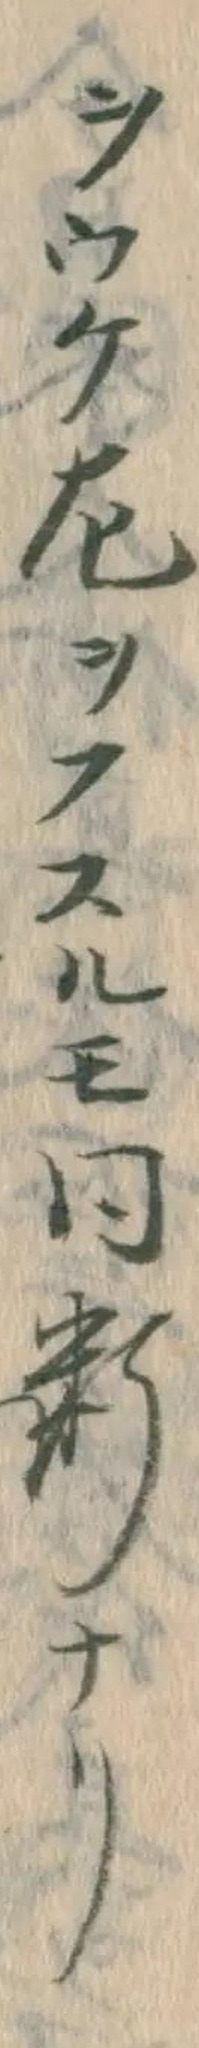ヲウケ左ヲフスルモ同断ナリ
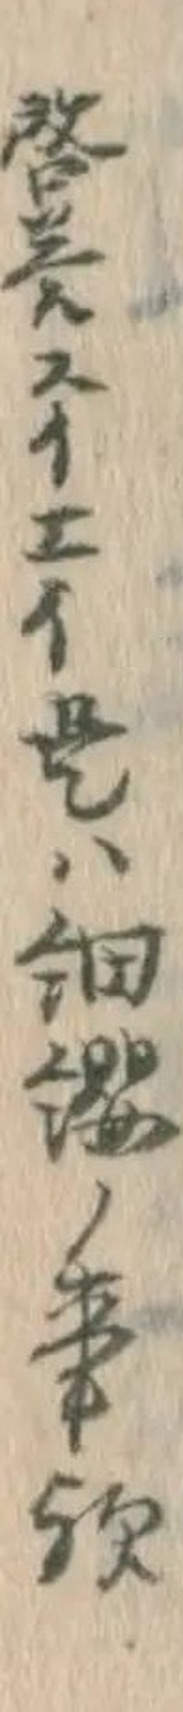啓答スイエイ是ハ細纓ノ事歟
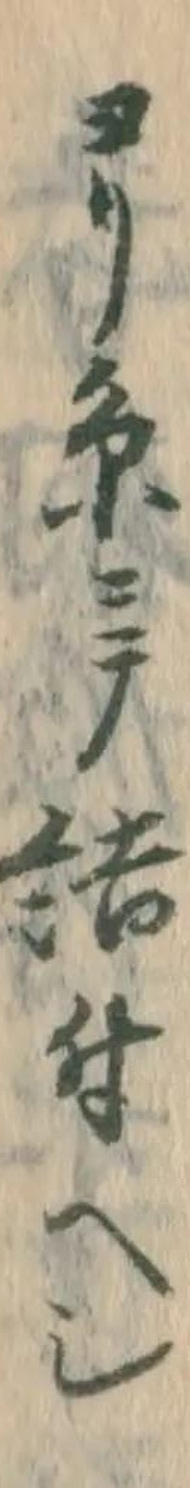ヨリ糸ニテ結付ヘシ

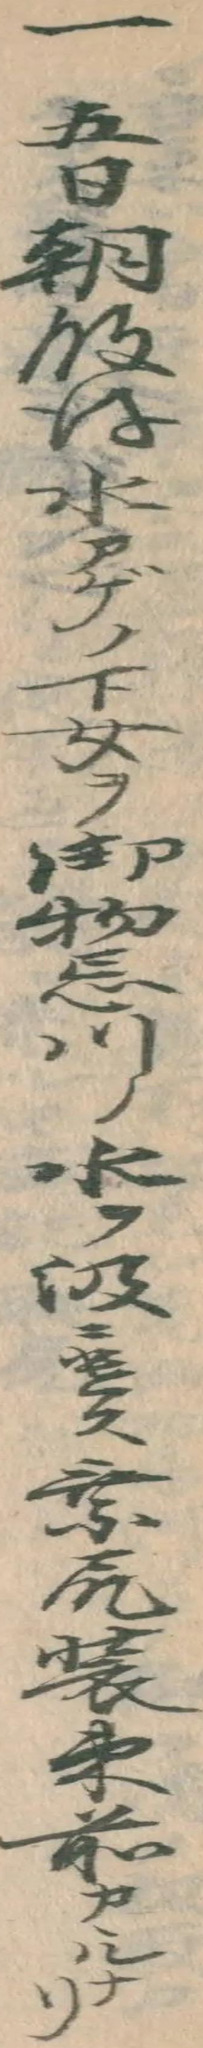一五日朝飯後水アゲノ下女ヲ御物忌川ノ水ヲ汲ニ遣ス乗尻装束前カヽルナリ
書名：賀茂社記録. 第11冊
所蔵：国立国会図書館 National Diet Library, JAPAN
